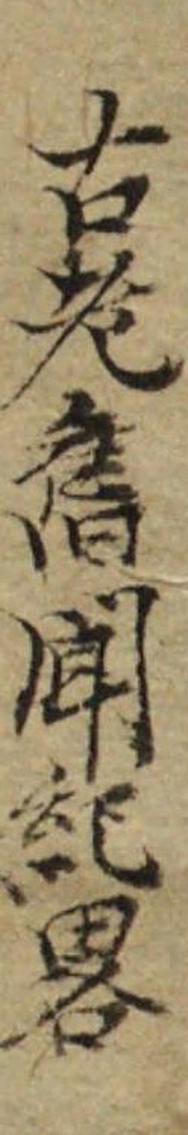古老旧聞紀略

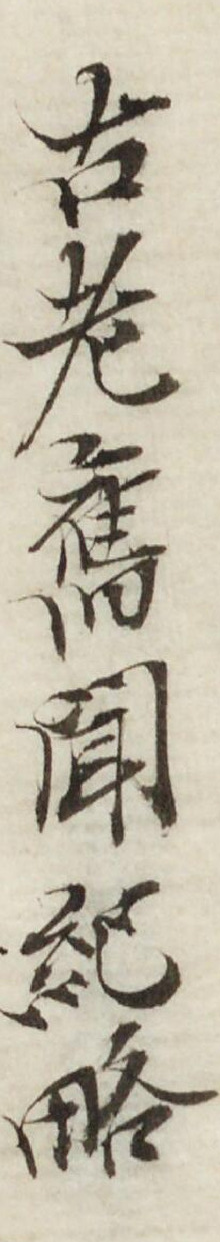古老旧聞紀略

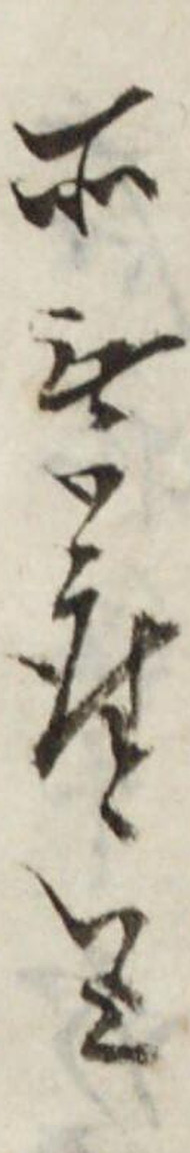所無御座候以上
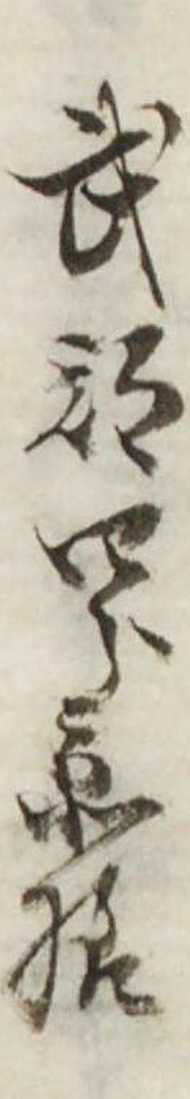武部四郎右衛門
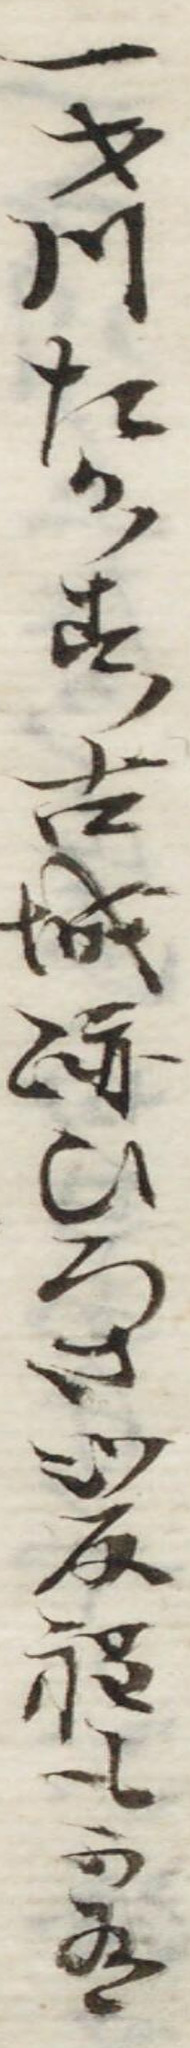一才川たかノすノ古城跡ひろさ弐反程も可有候
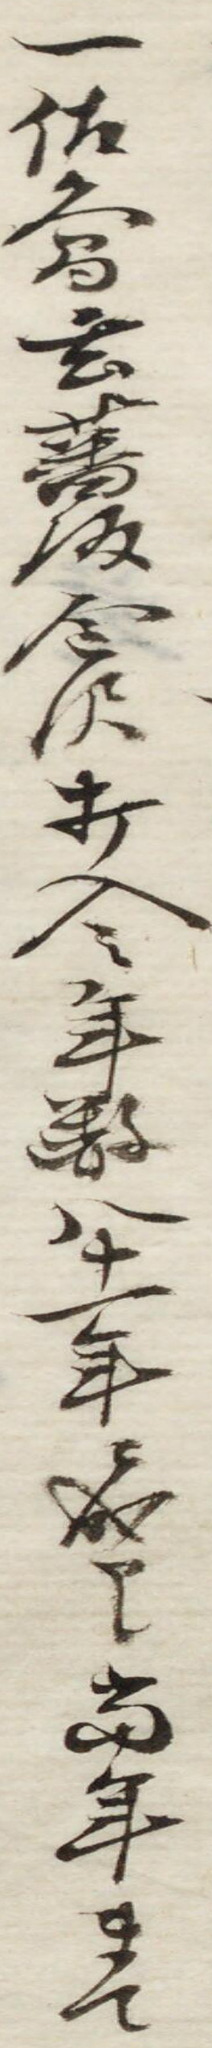一佐久間玄蕃殿金沢打入之年数八十一年に成申候当年まて
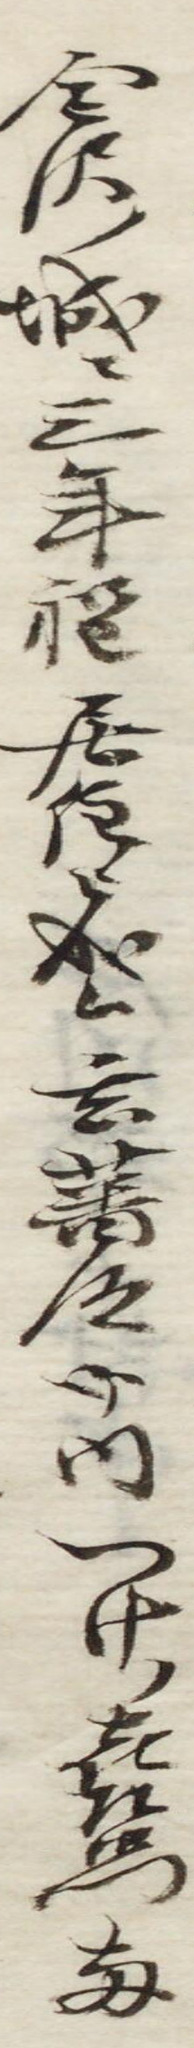金沢ノ城に三年程居住被成候玄蕃殿御内つけノ喜左衛門両
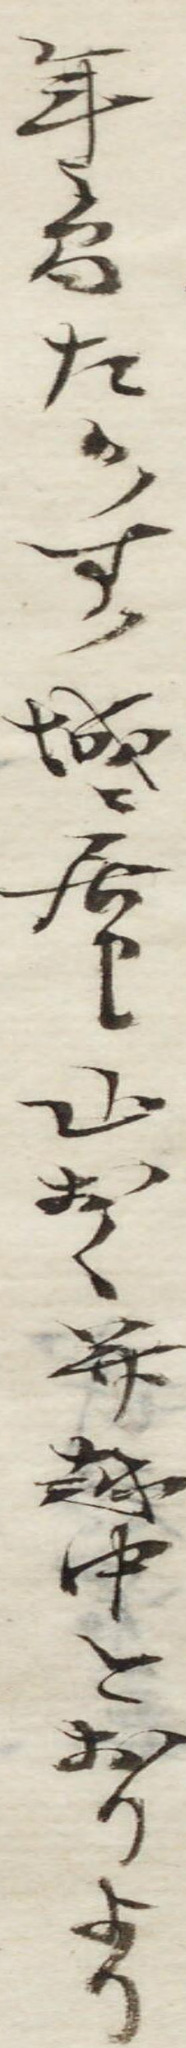年之間たかノすノ城に居申候山おく并越中とおりより
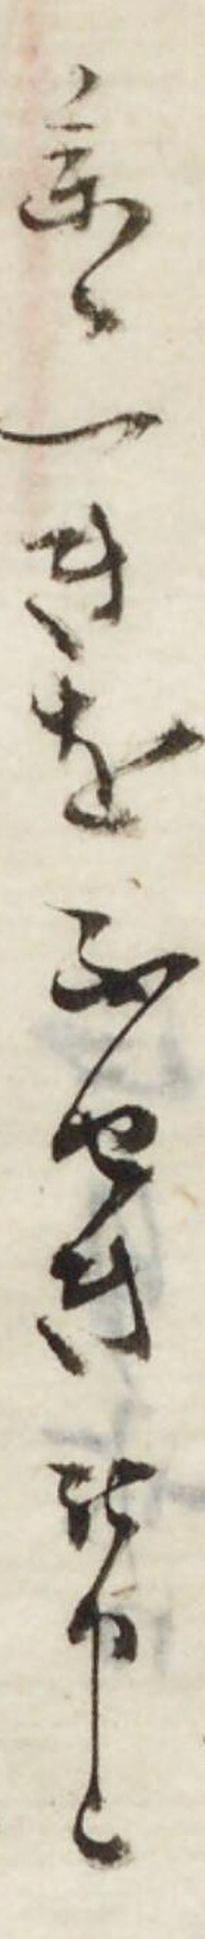参候一きをふせき被申候
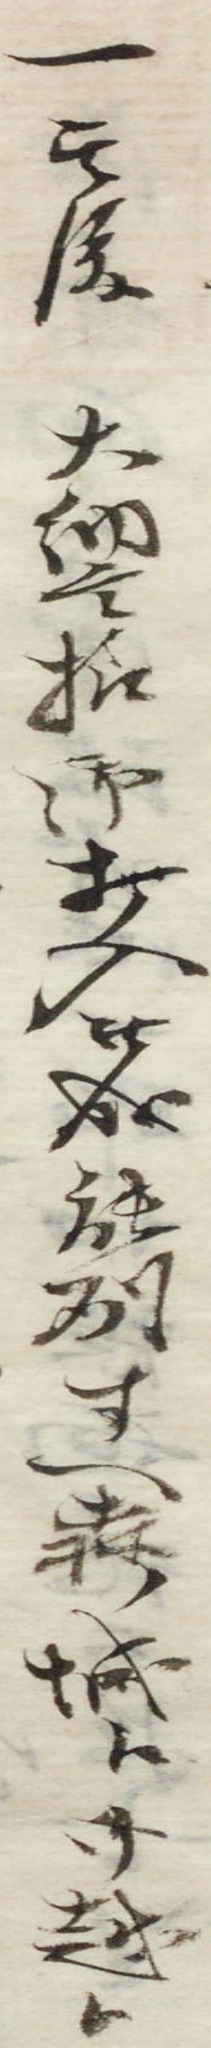一其後大納言様御打入被成能州すへ森ノ城え御越候
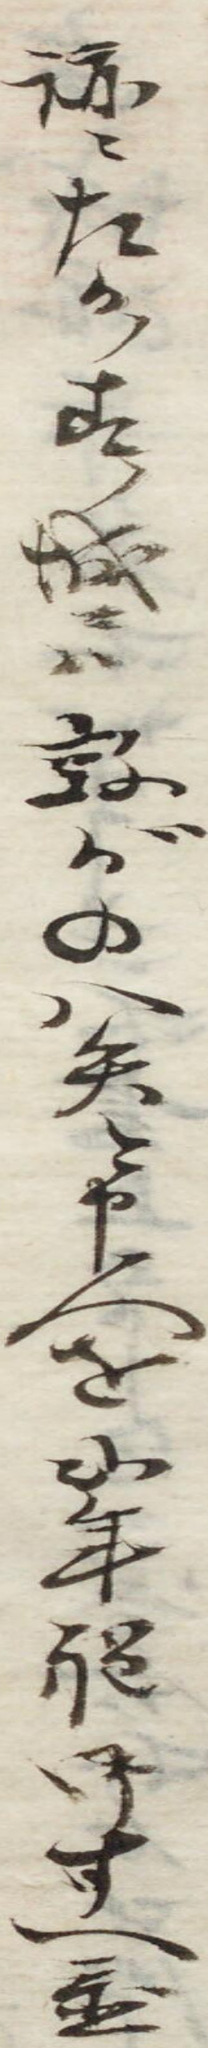跡にたかノすノ城には敦がの八彌矢と申人を弐年程御すへ置
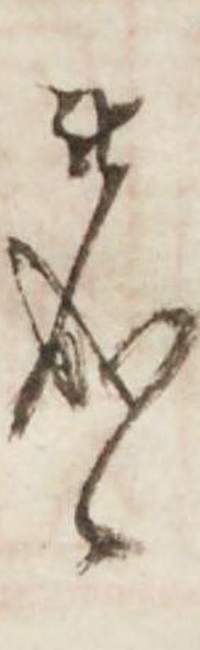被成候
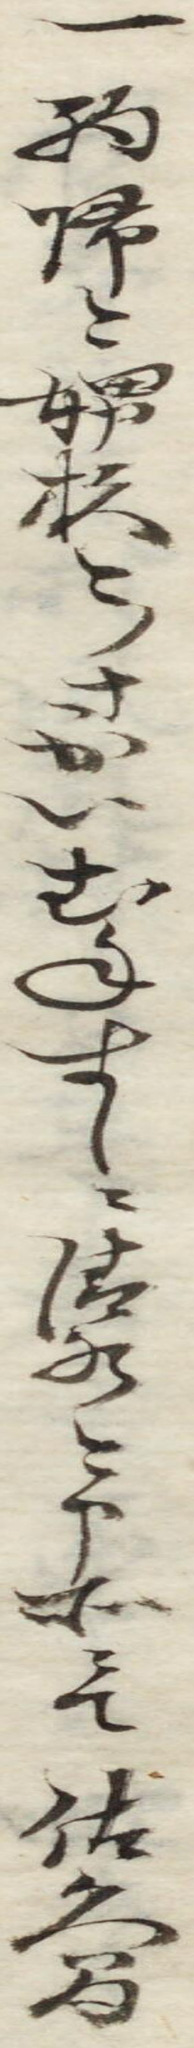一駒帰と娚杉とのさかいむねよしに清水と申所にて佐久間
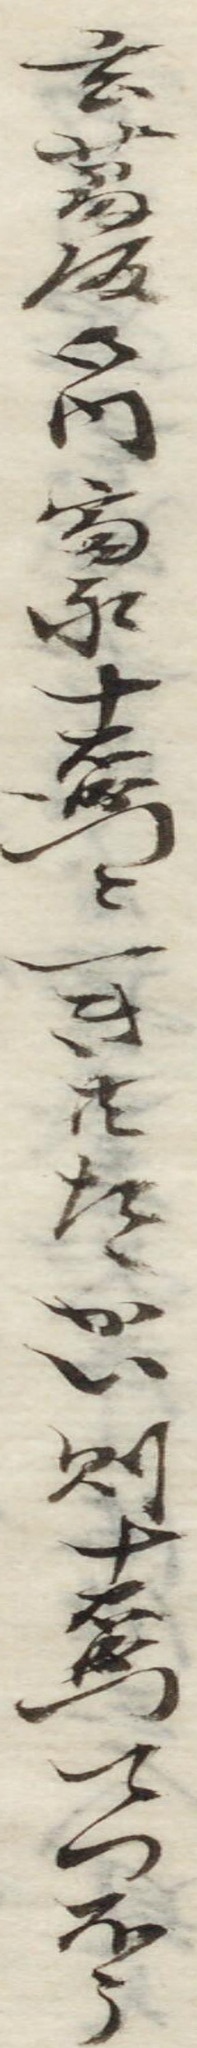玄蕃殿御富永十右衛門と一き共たゝかい則十右衛門てつほう
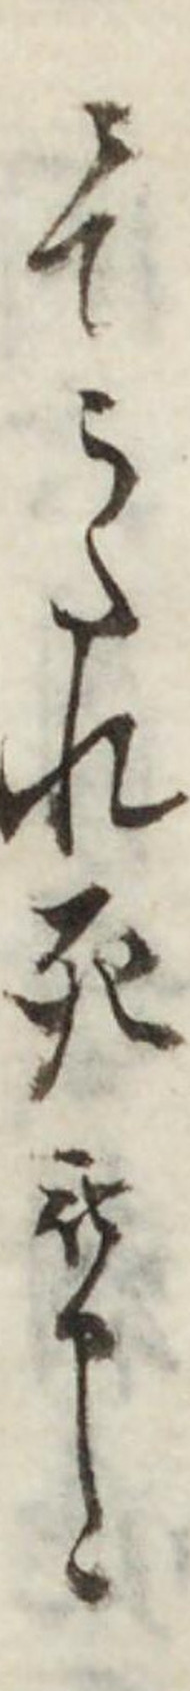にてうたれ死被申候
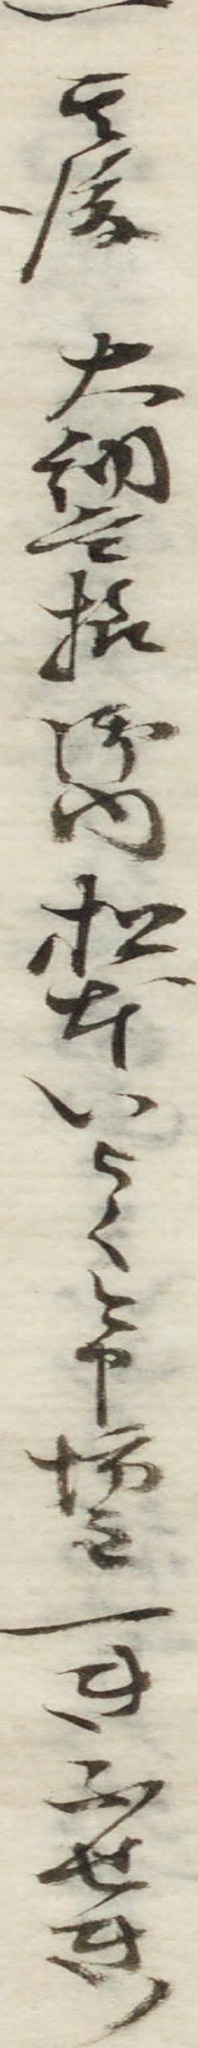一其後大納言様御内松本いらくと申坊主一きふせきノ
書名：古老旧聞紀略
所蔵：Ishikawa Prefectural Library
